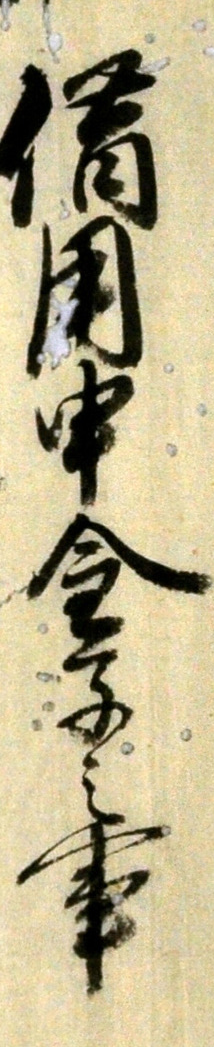借用申金子之事
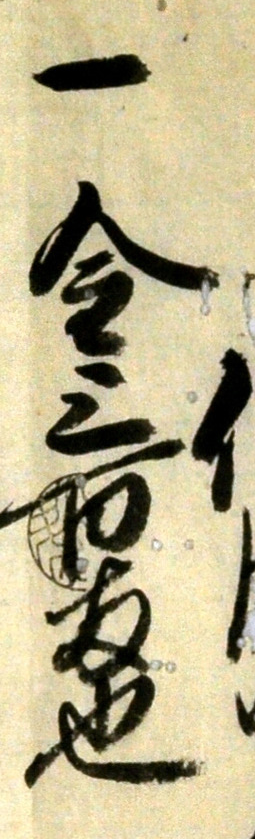一金三百両也
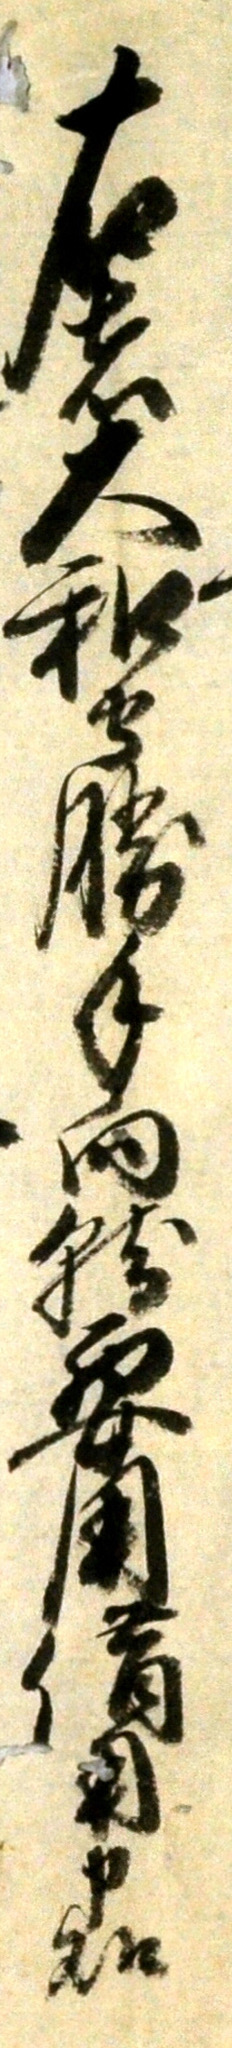右者大和守勝手向就要用借用申処
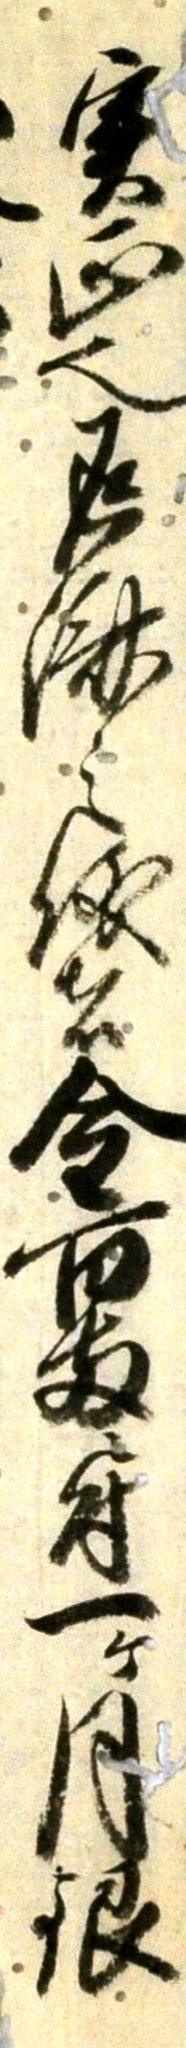実正也返済之儀者金百両ニ付一ヶ月銀
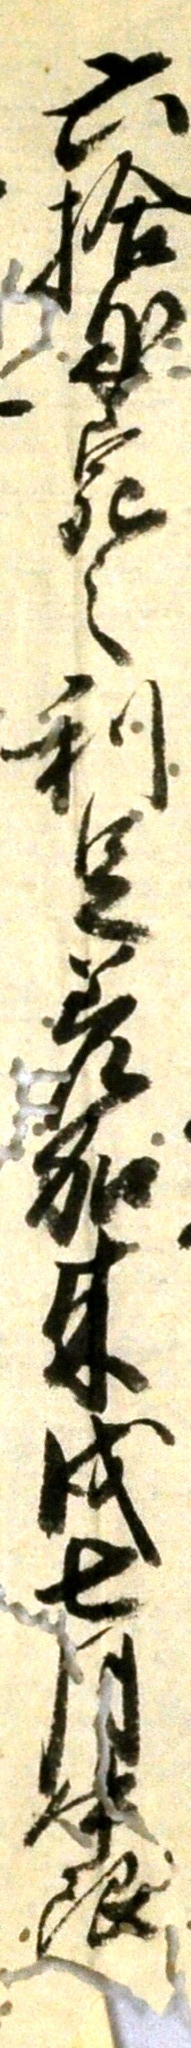六拾匁宛之利足差加来戌七月中限
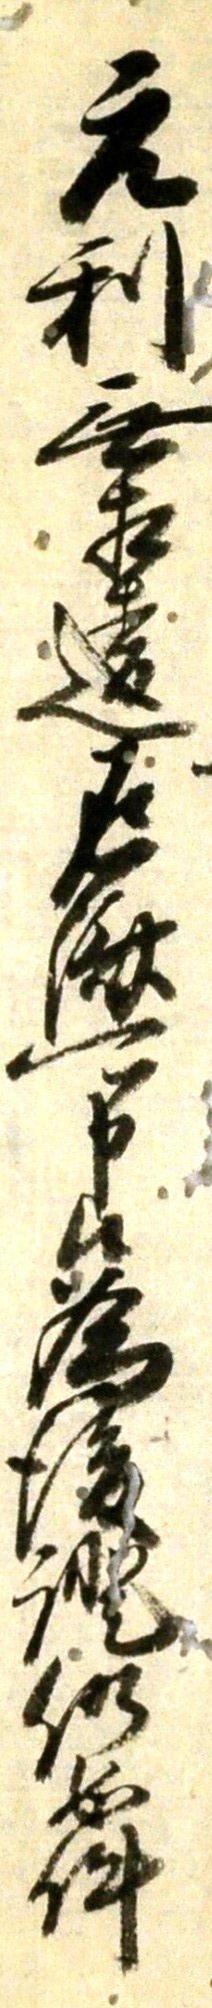元利無相違返済可申候為後証仍如件
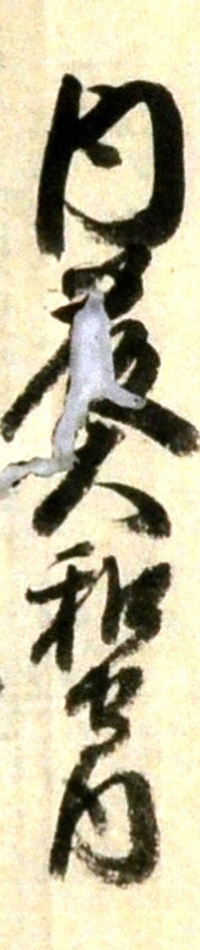内藤大和守内
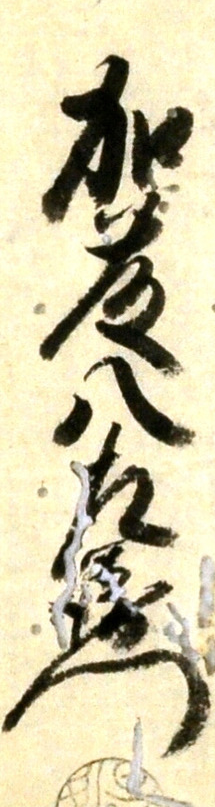加藤八左衛門㊞
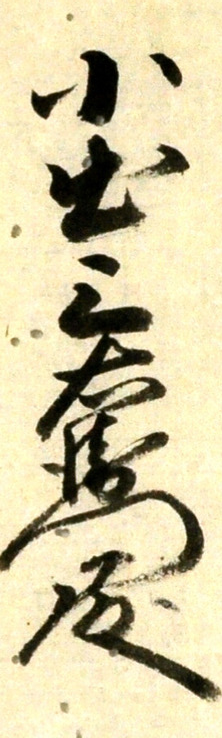小出三右衛門殿
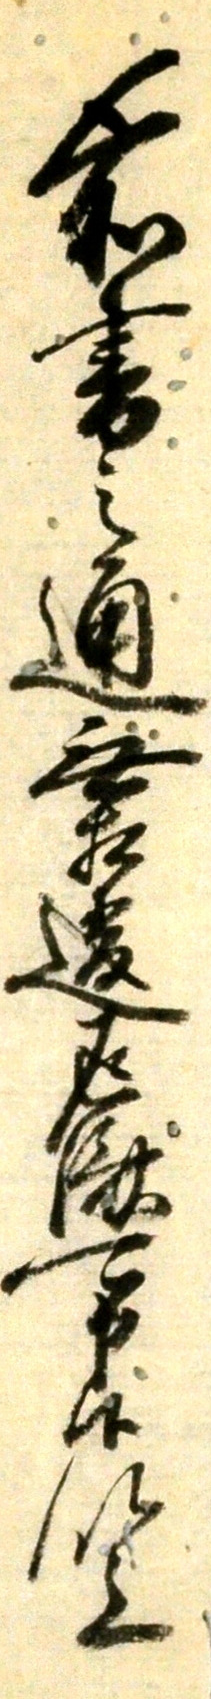前書之通無相違返済可申候以上
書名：借用申金子之事
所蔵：伊那市立高遠町図書館・合同会社AMANE
